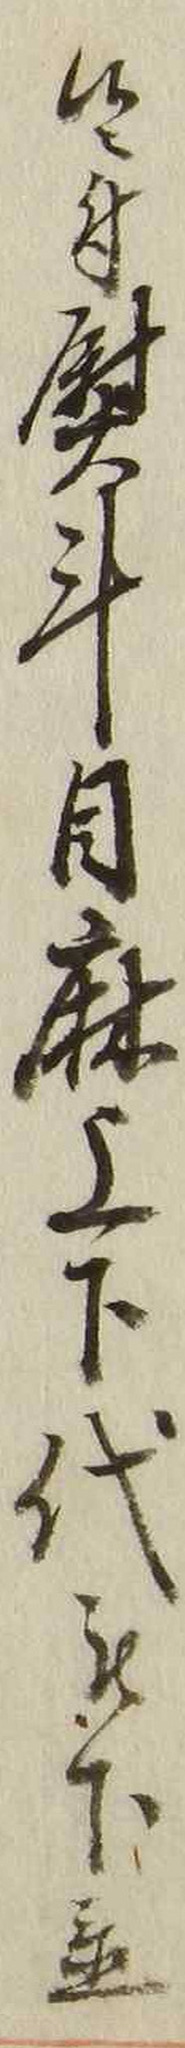候ニ付熨斗目麻上下代被下置
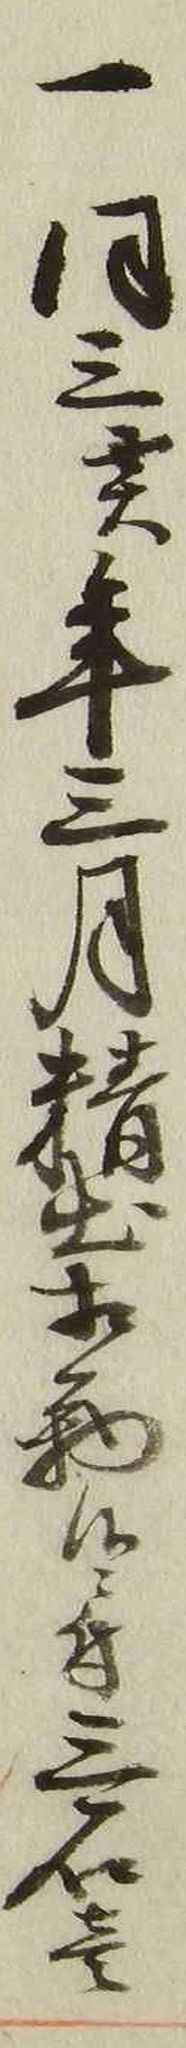一同三亥年三月精出相勤候ニ付三石壱
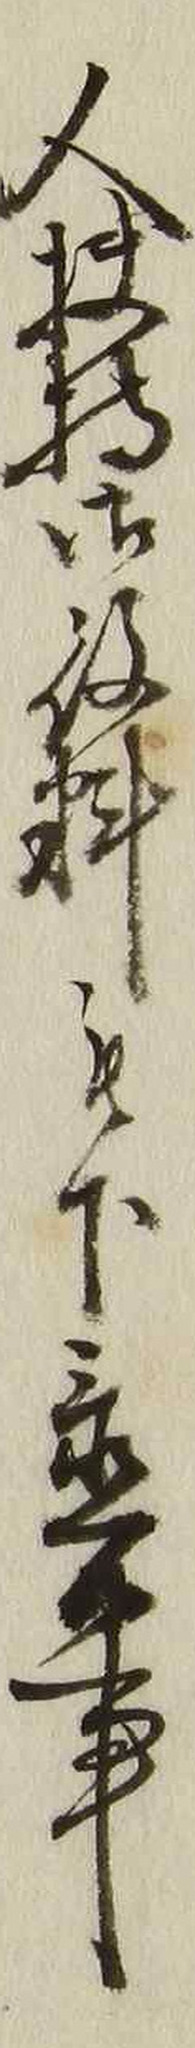人扶持御役料被下置候事
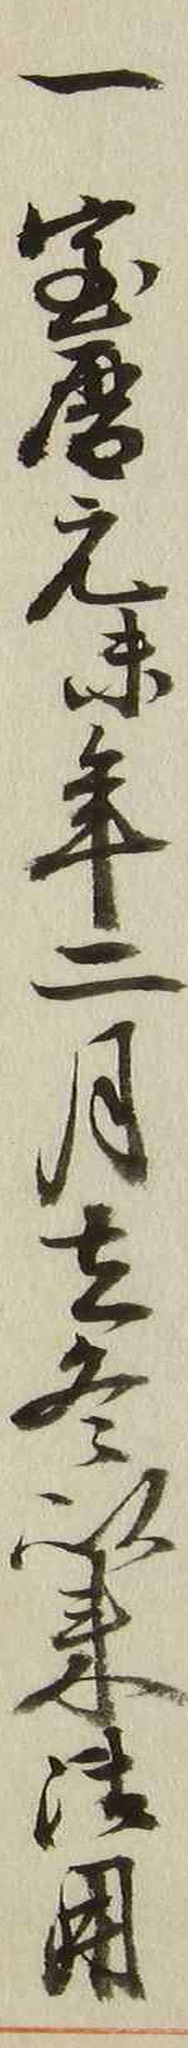一宝暦元未年二月去冬以来御用
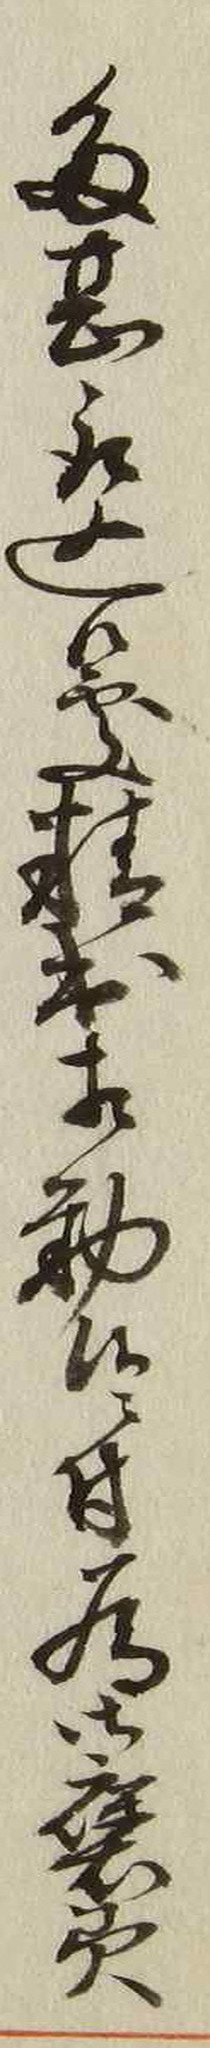多甚取込候処精出相勤候ニ付為御褒美
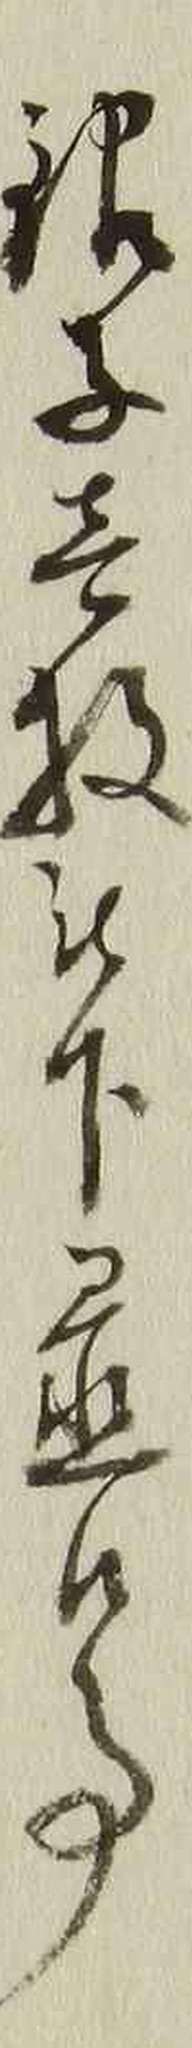銀子壱枚被下置候事
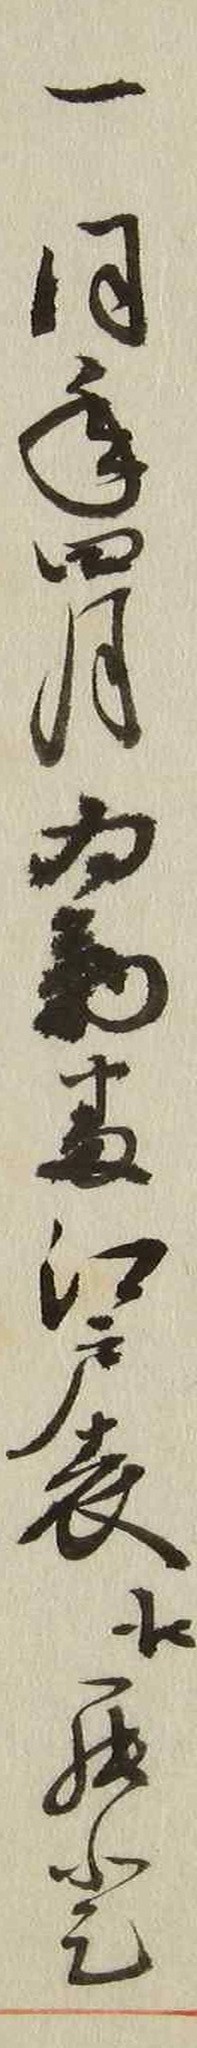一同年四月為勤番江戸表江罷登
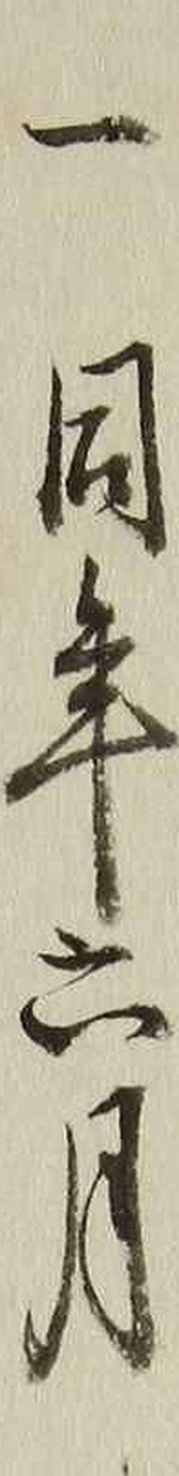一同年六月
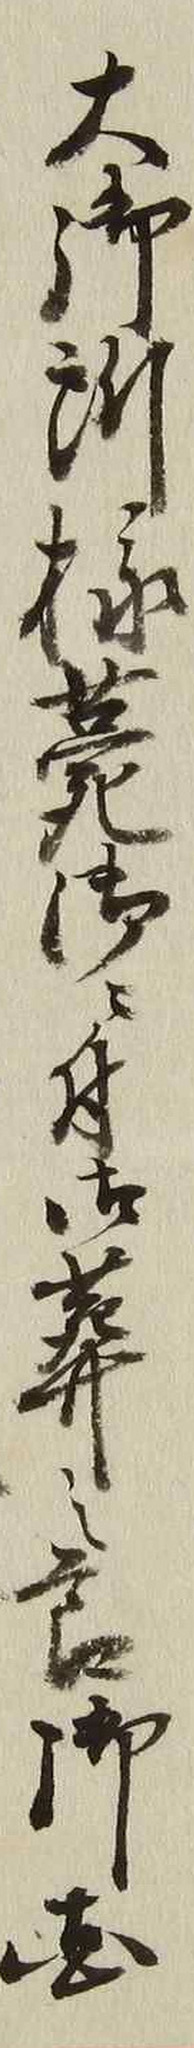大御所様薨御ニ付御葬之節御固
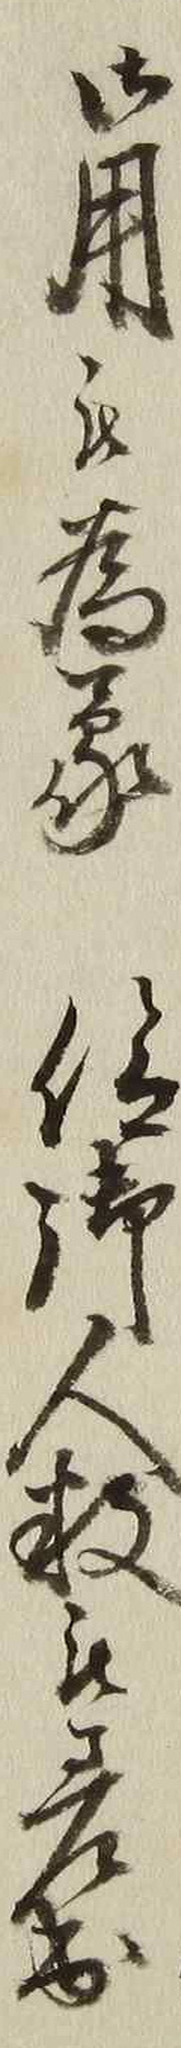御用被為蒙仰御人数被差出
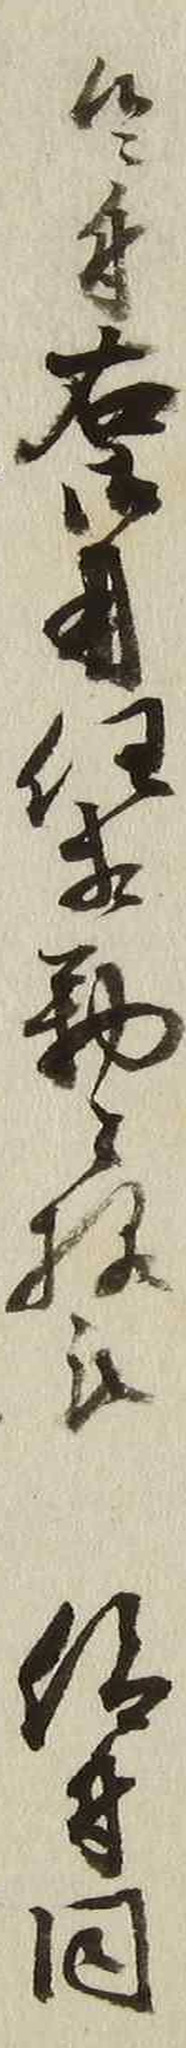候ニ付右御用相勤候様被仰付同
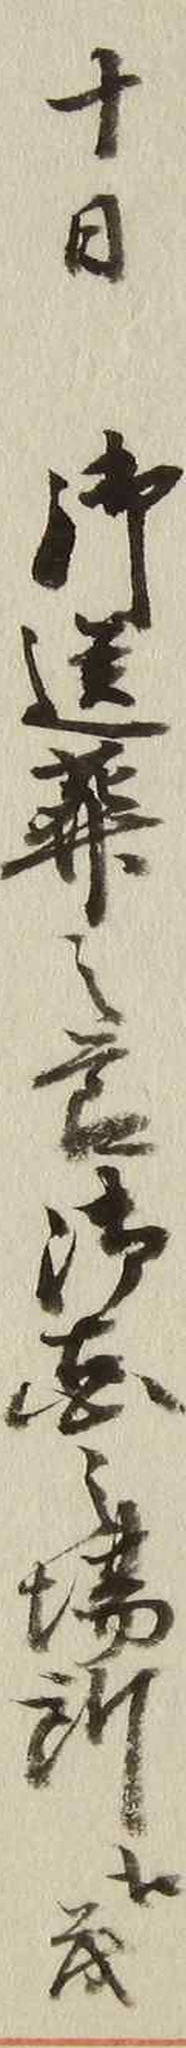十日御送葬之節御固之場所江茂
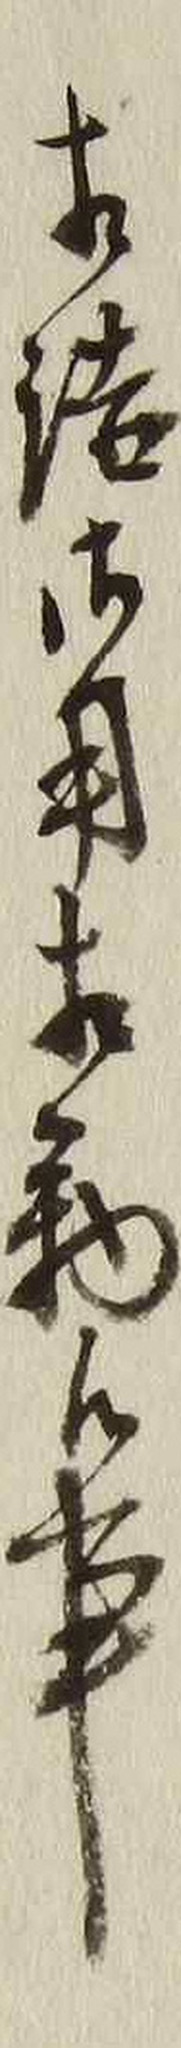相詰御用相勤候事
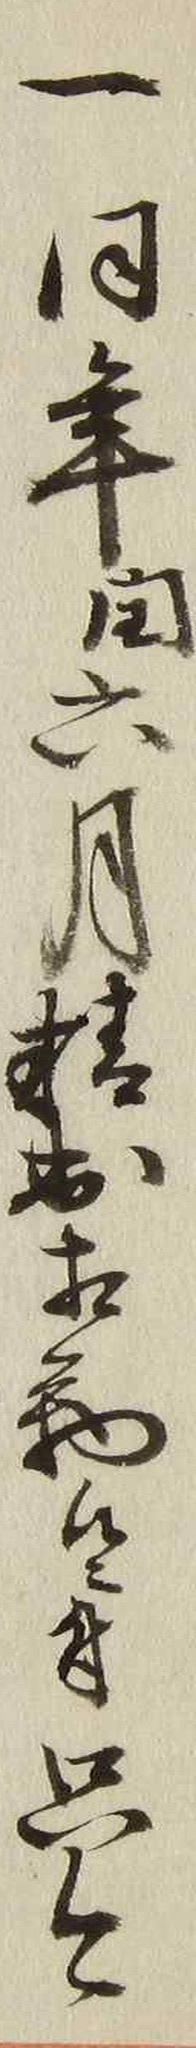一同年閏六月精出相勤候ニ付只今
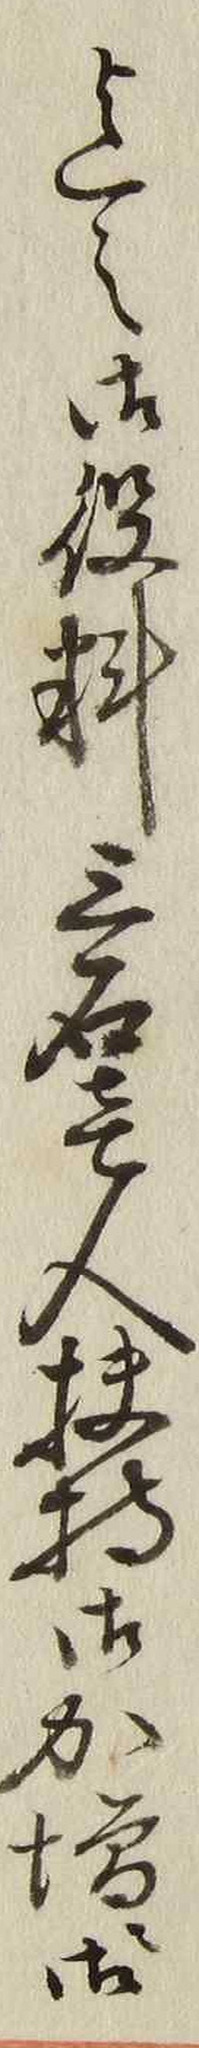迄之御役料三石壱人扶持御加増ニ御
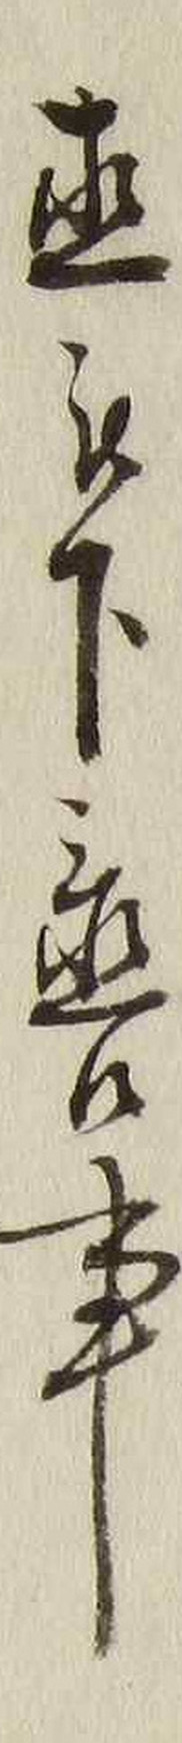直被下置候事
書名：諸士系譜　巻之27　い之部27
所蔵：会津若松市立会津図書館
